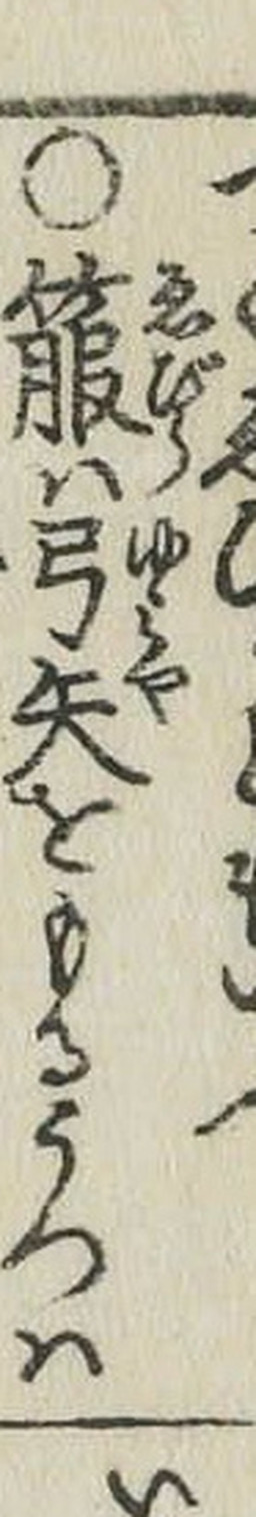○箙は弓矢をもるうつは
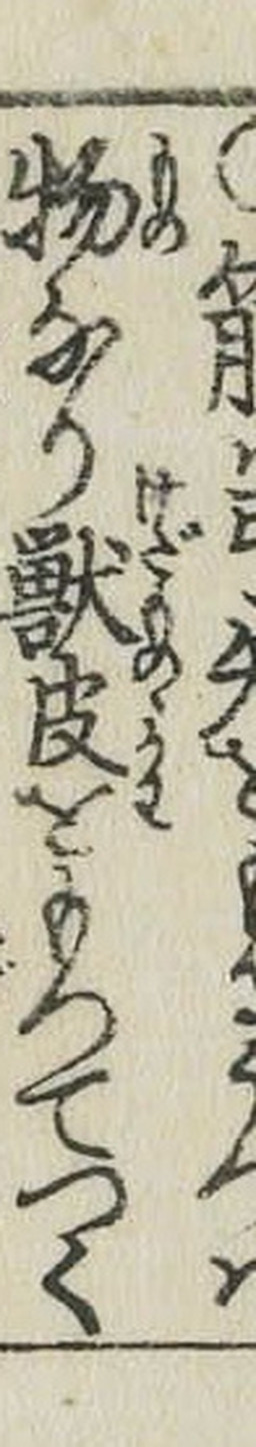物なり獣皮をもつてつく
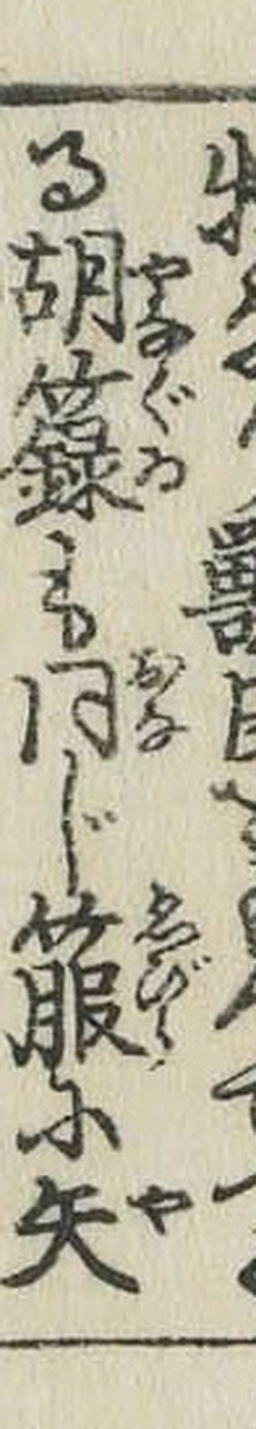る胡籙も同じ箙に矢
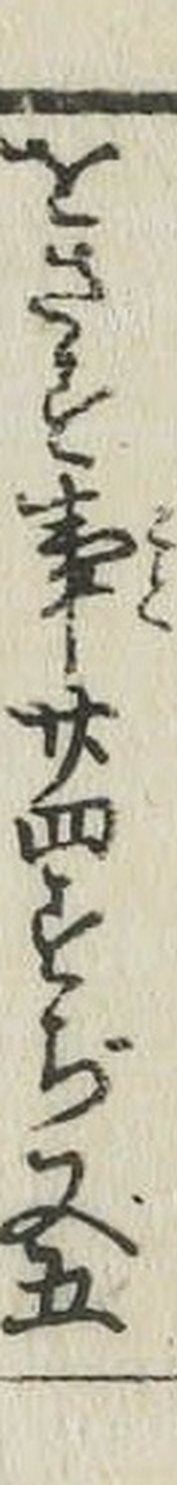をさす事廿四すじ又五
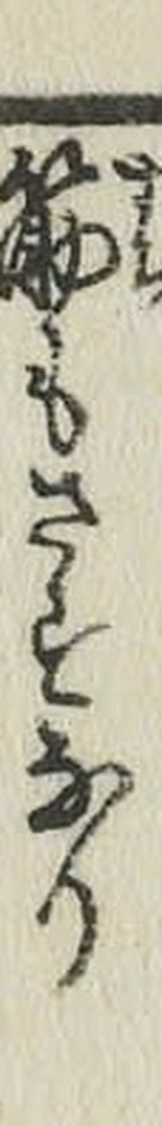筋もさすなり
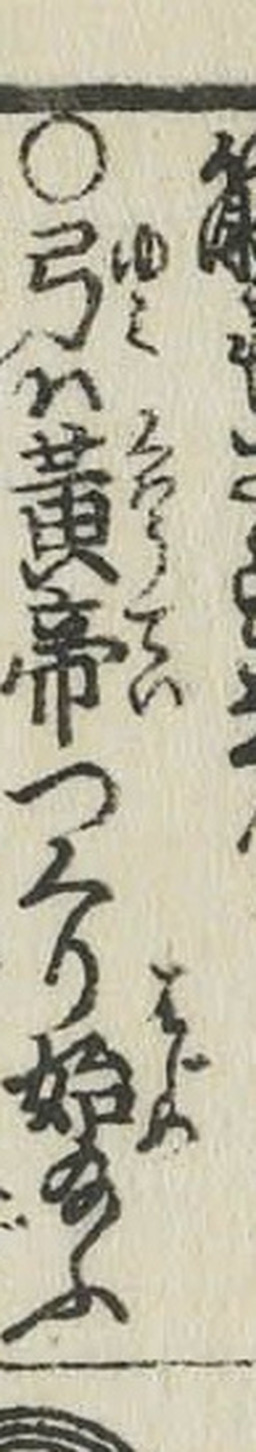○弓は黄帝つくり始給ふ
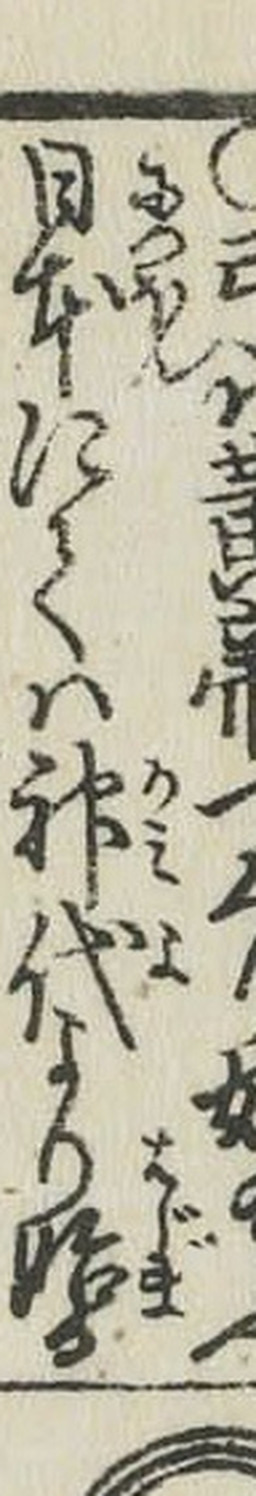日本にては神代より始る
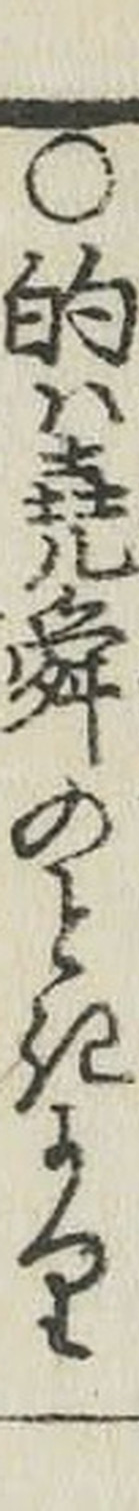○的は堯舜のときより
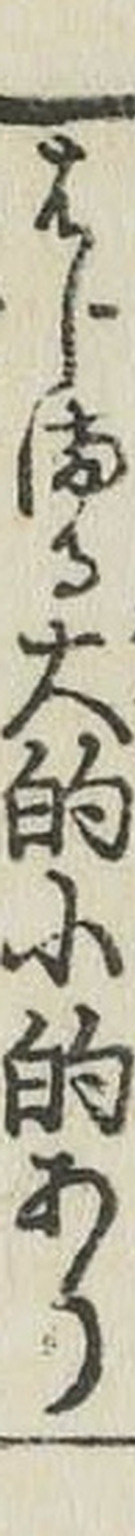はじまる大的小的あり
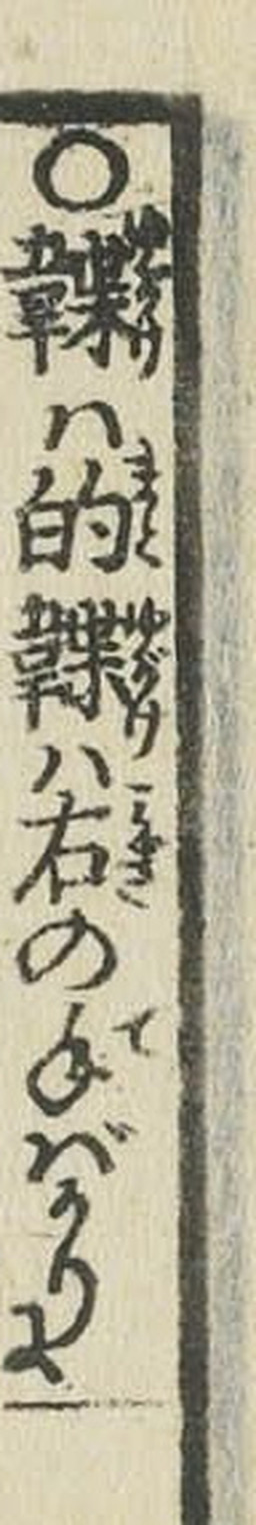○韘は的韘は右の手ばかりに
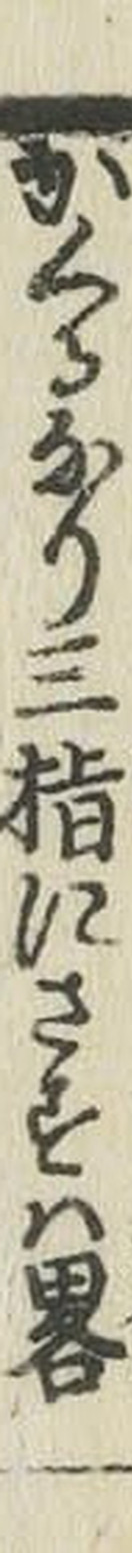かくるなり三指にさすは略
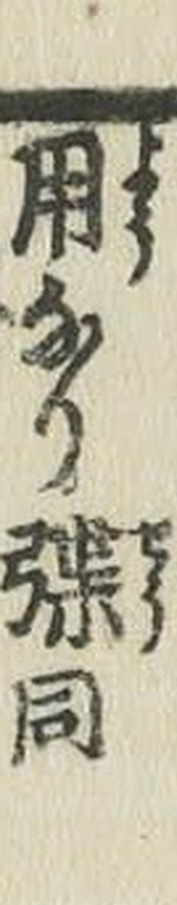用なり弽同
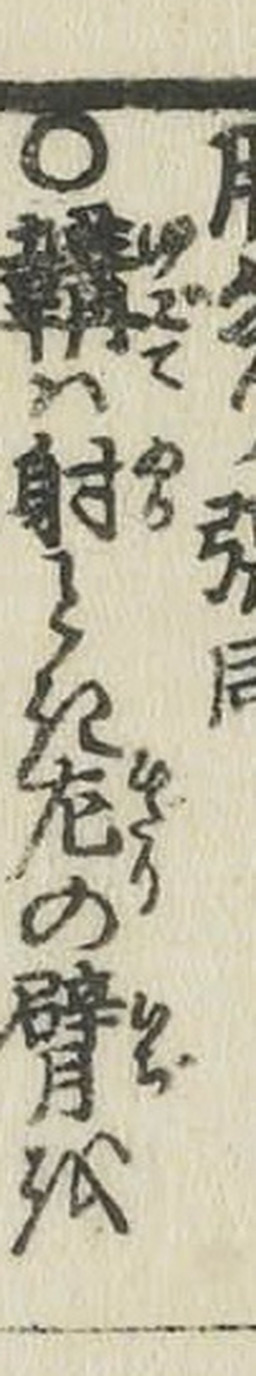○韝は射とき左の臂を
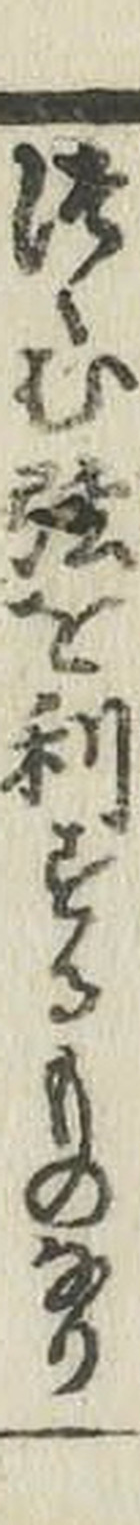つゝむ弦を利するものなり
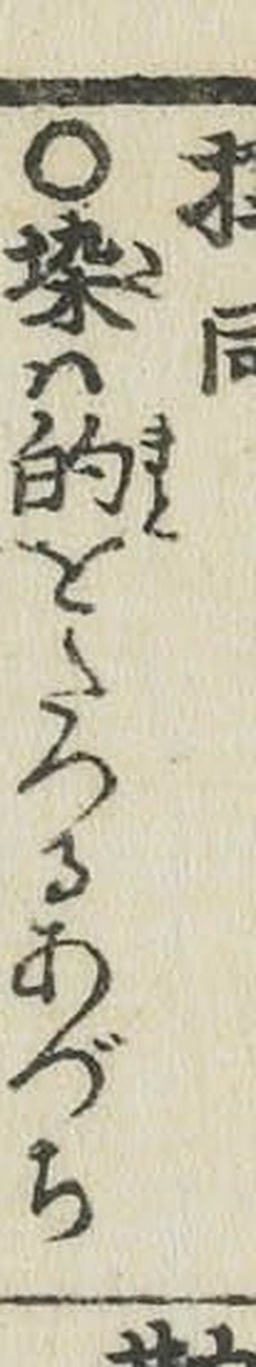○垛は的をたつるあづち
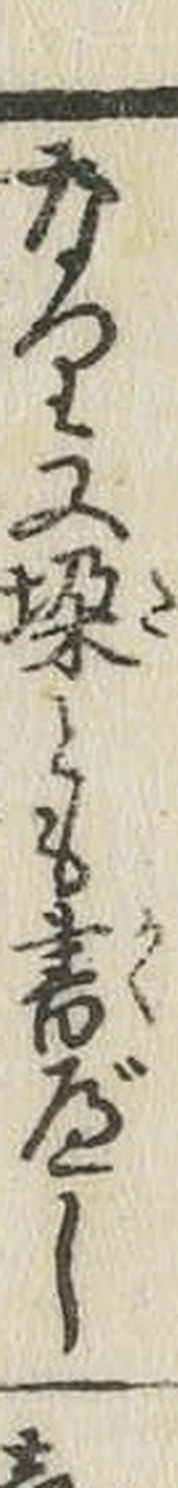なり又垜とも書べし
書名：増補頭書訓蒙図彙大成 10巻 5:巻之9-11
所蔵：東京学芸大学教育コンテンツアーカイブ
